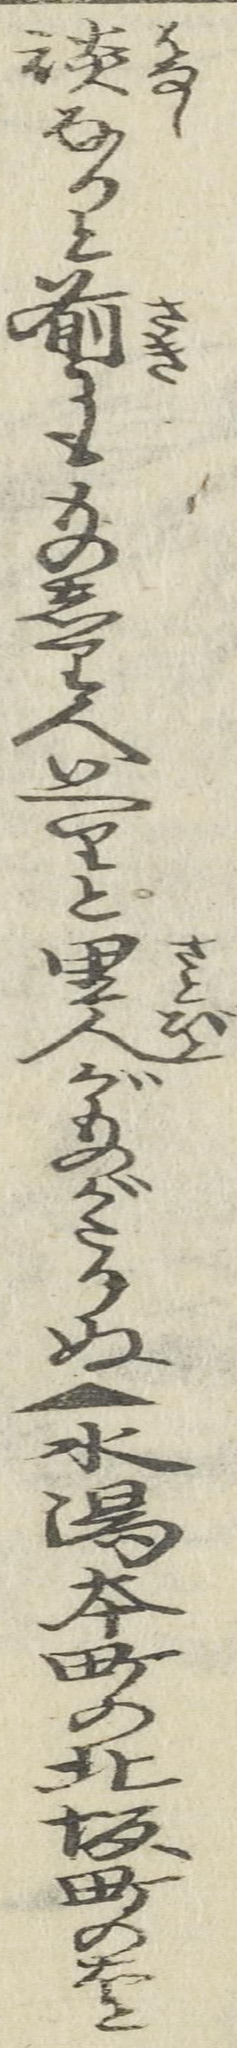談なりと前にもものしり人いへりと里人がものがたりぬ▲水湯本町の北坂町のほと
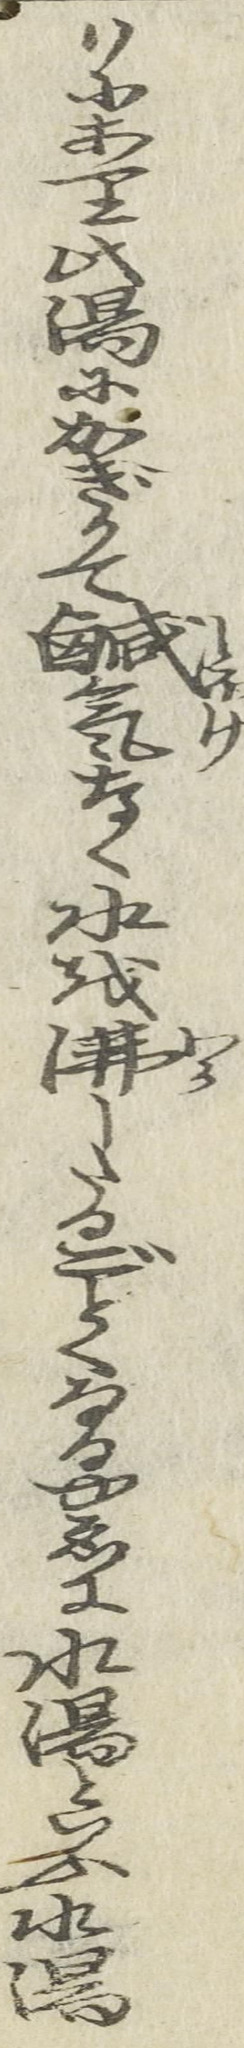りにあり此湯にかぎりて鹹気なく水を沸したるごとくなるゆゑに水湯といふ水湯
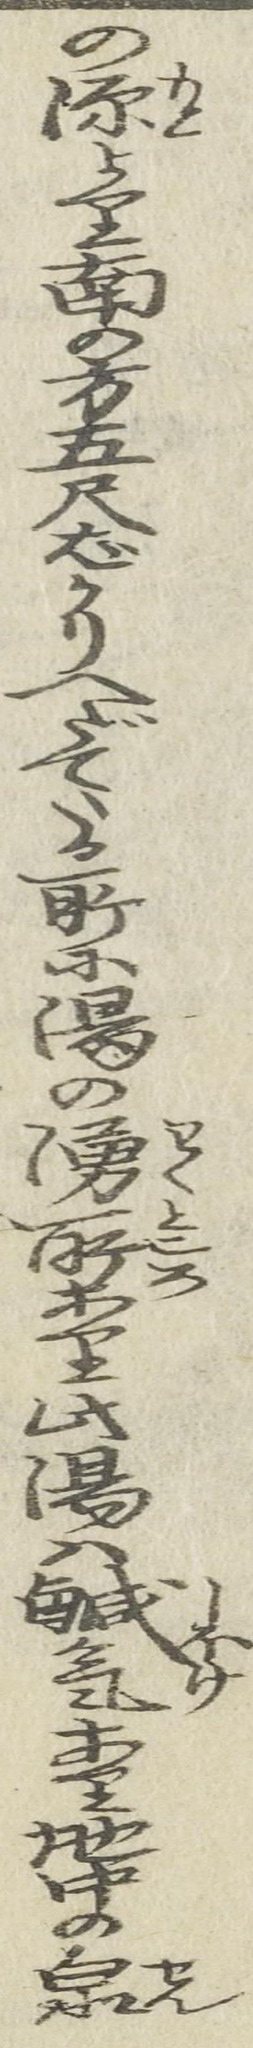の源より南の方五尺ばかりへだてたる所に湯の湧所あり此湯は鹹気あり地中の泉
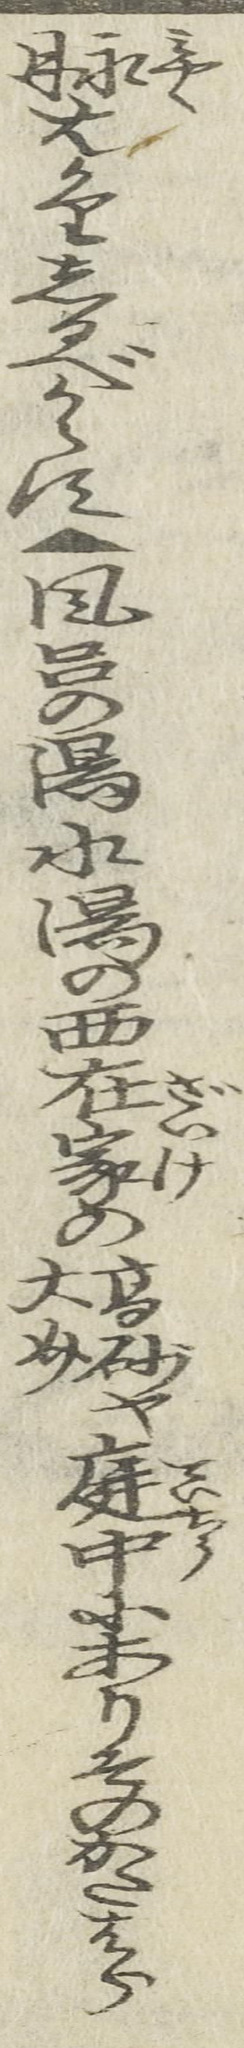脈はかりしるべからす▲風呂の湯水湯の西在家の高砂や大介庭中にありそのかたはら
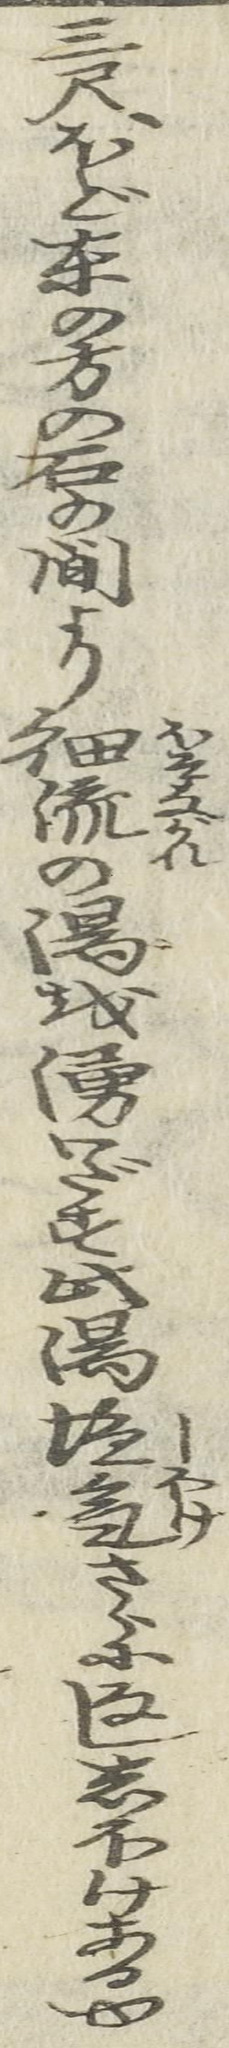三尺ほど東の方の石の間より細流の湯を湧いだす此湯塩気さらになししほけあるゆ
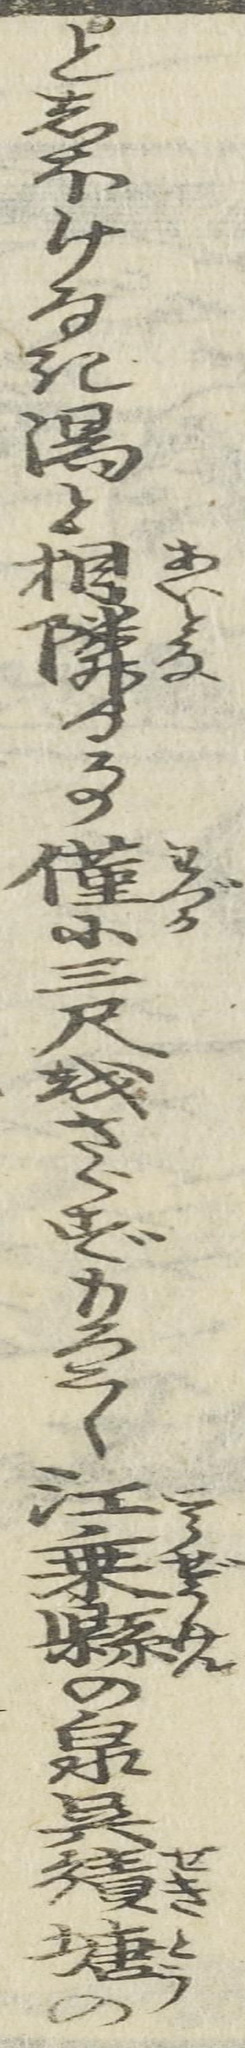としほけなき湯と相隣る事僅に三尺をさらずもろこし江乗県の泉呉績塘の
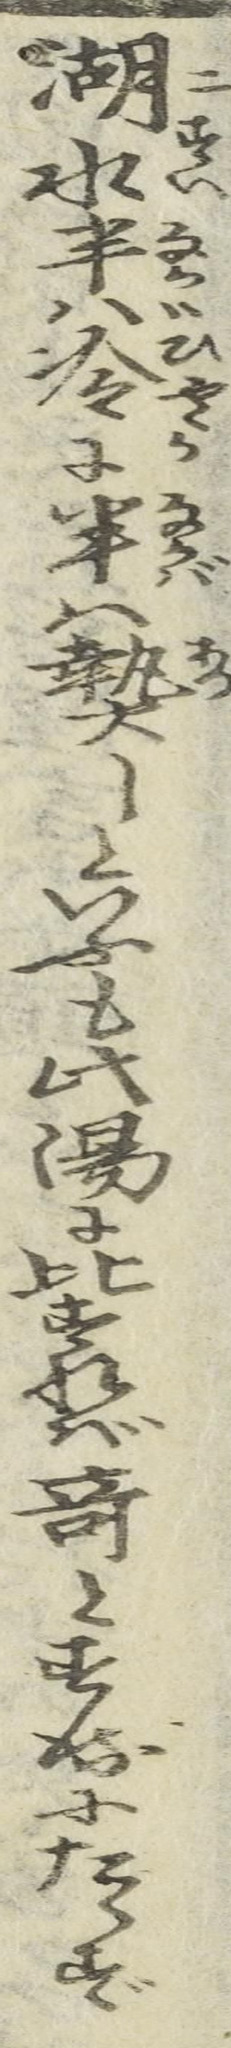湖水半ば冷に半は熱しといふも此湯に比すれば奇とするにたらず
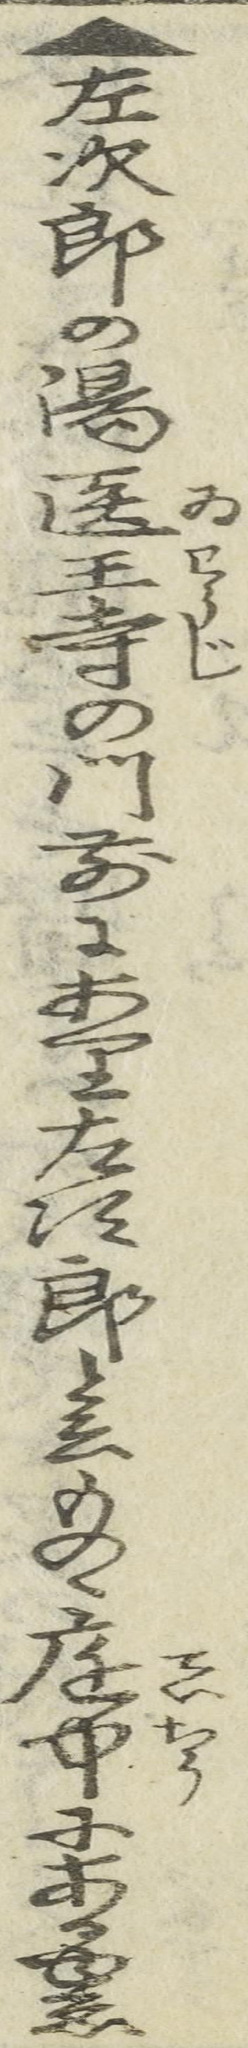▲左次郎の湯医王寺の門前にあり左次郎と云ものゝ庭中にあるゆゑ
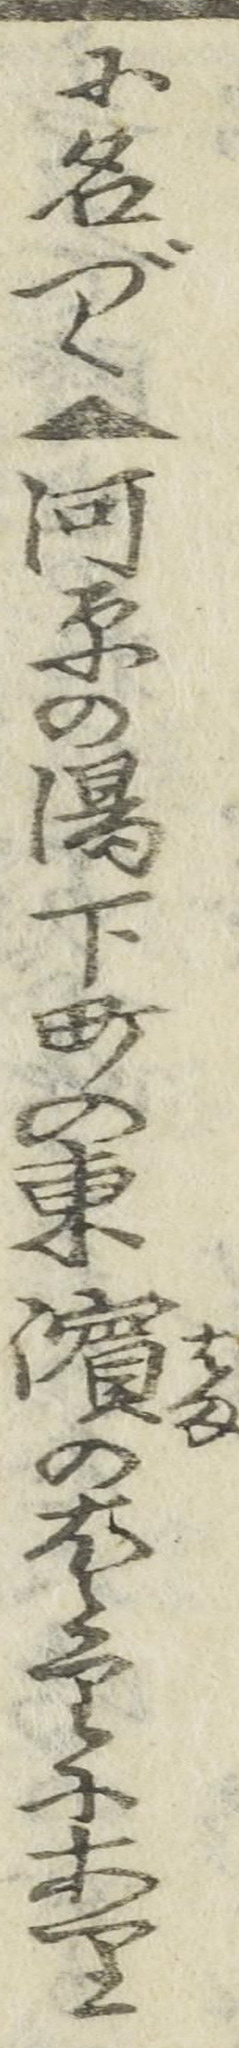に名づく▲河原の湯下町の東浜のほとりにあり
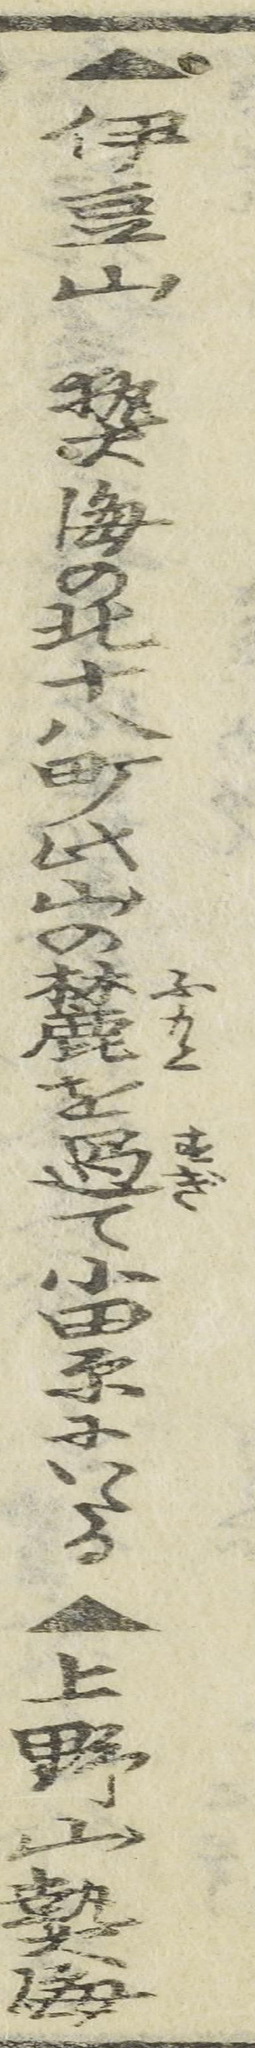▲伊豆山熱海の北十八町此山の麓を過て小田原にいたる▲上野山熱海
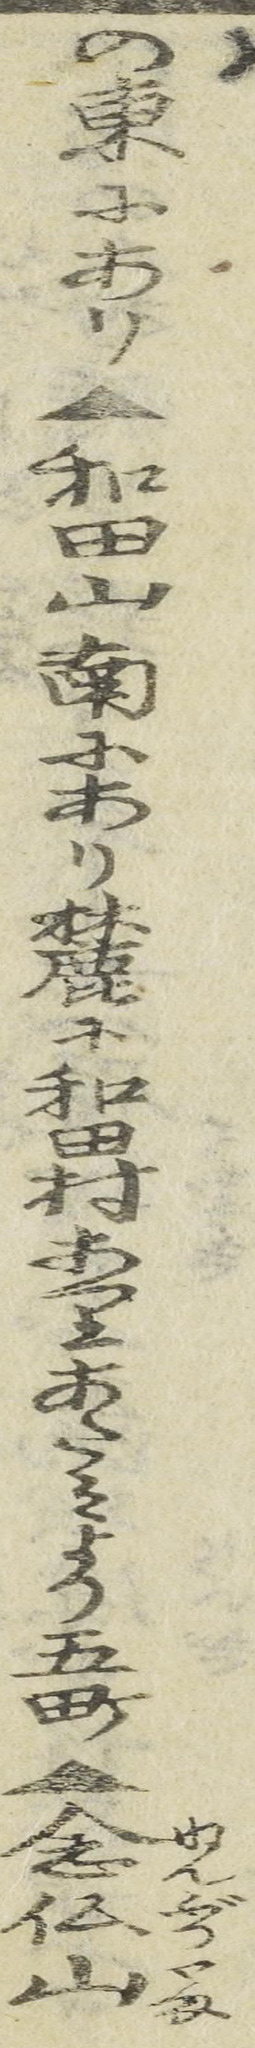の東にあり▲和田山南にあり麓に和田村ありあたみより五町▲念仏山
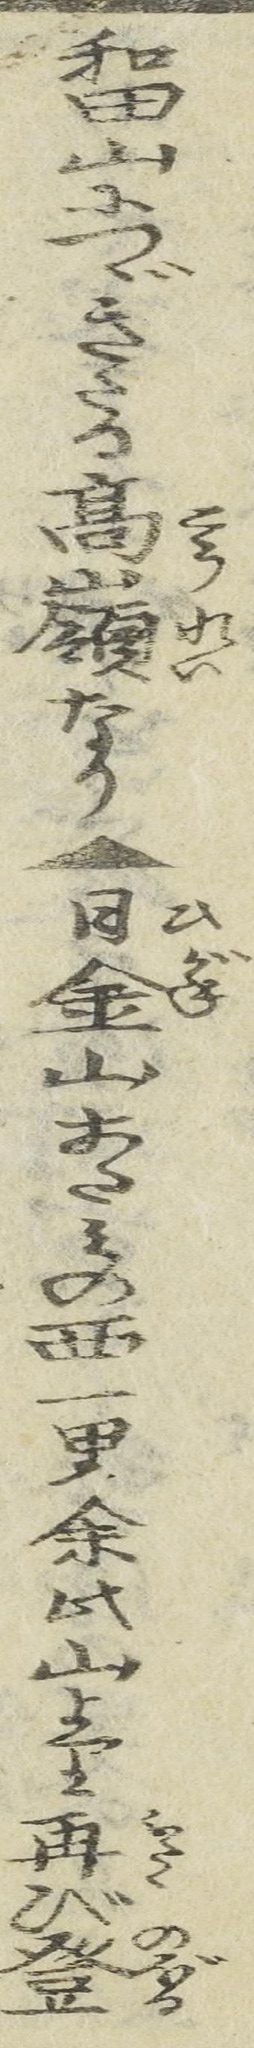和田山につゞきたる高嶺なり▲日金山あたみの西一里余此山より再び登
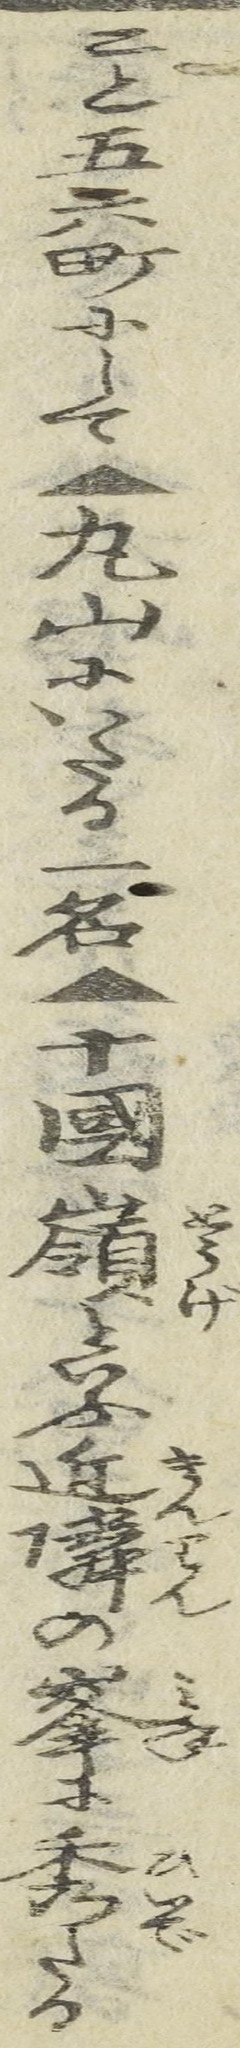こと五六町にして▲丸山にいたる一名▲十国嶺といふ近隣の峯に秀たる
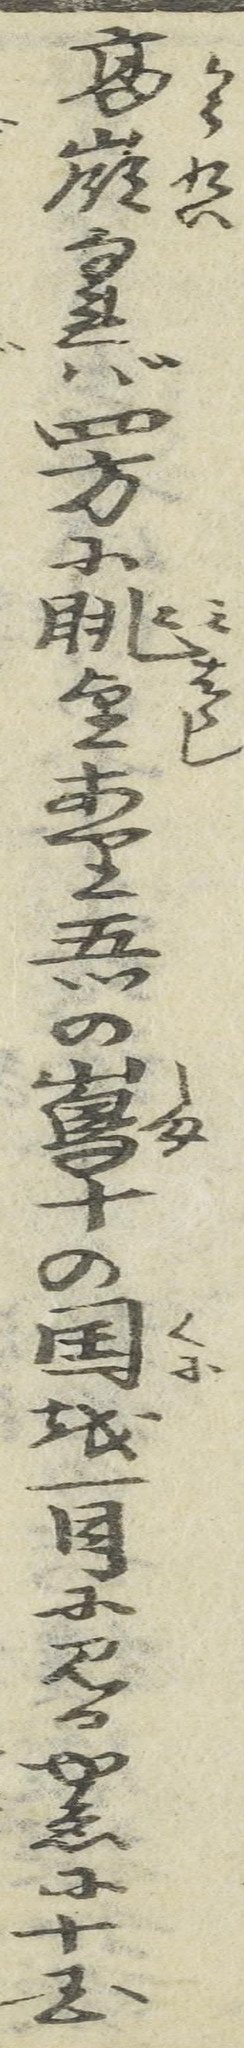高嶺なれば四方に眺望あり五つの島十の国を一目に見るゆゑに十国
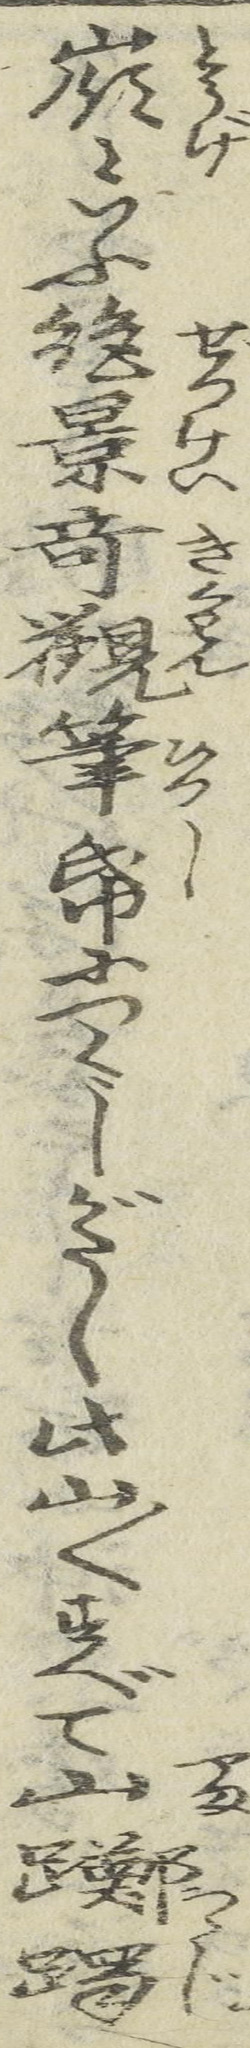嶺といふ絶景奇観筆紙につくしがたし此山〳〵すべて山躑躅
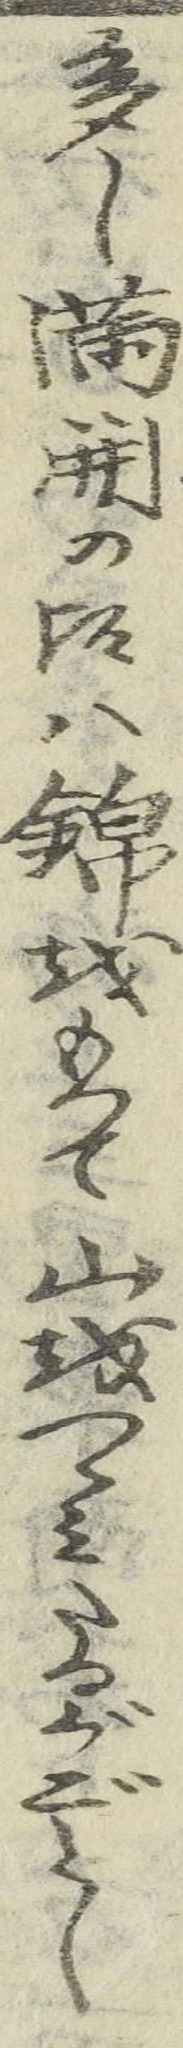多し満開の頃は錦をもつて山をつゝみたるがごとし
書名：熱海温泉圖彙
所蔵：東京大学地震研究所図書室 Earthquake Research Institute Library, The University of Tokyo, JAPAN
